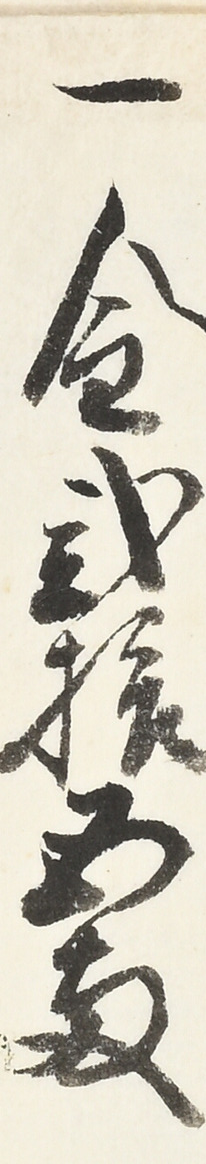一金弐拾五両
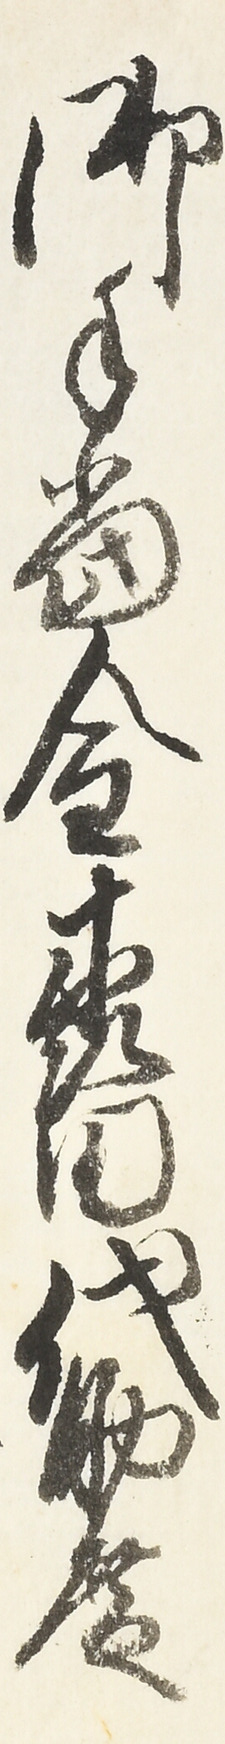御手當金森田代助殿
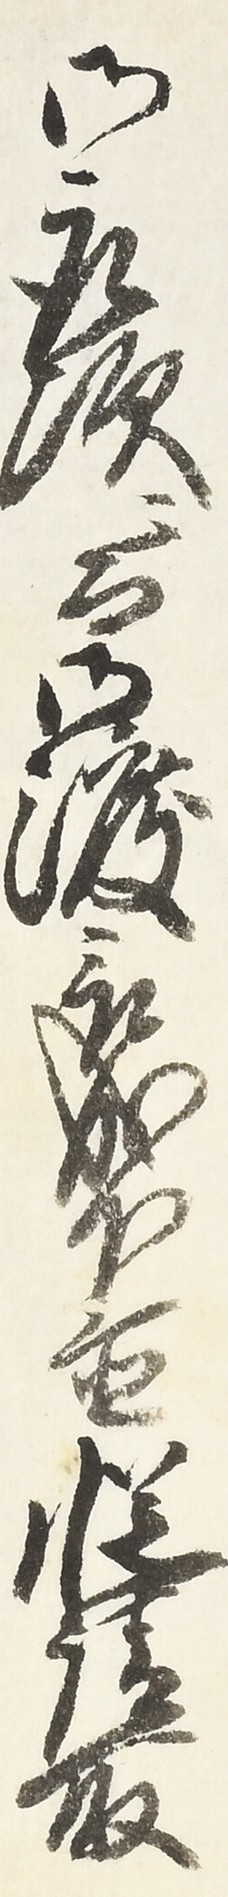御取次にて御渡被成下置慥請取
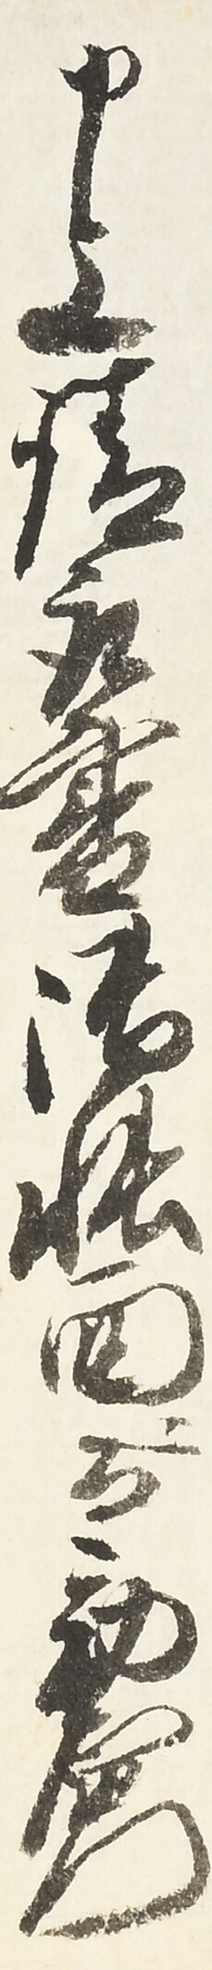申上請取書御帳面に而勘右衛門
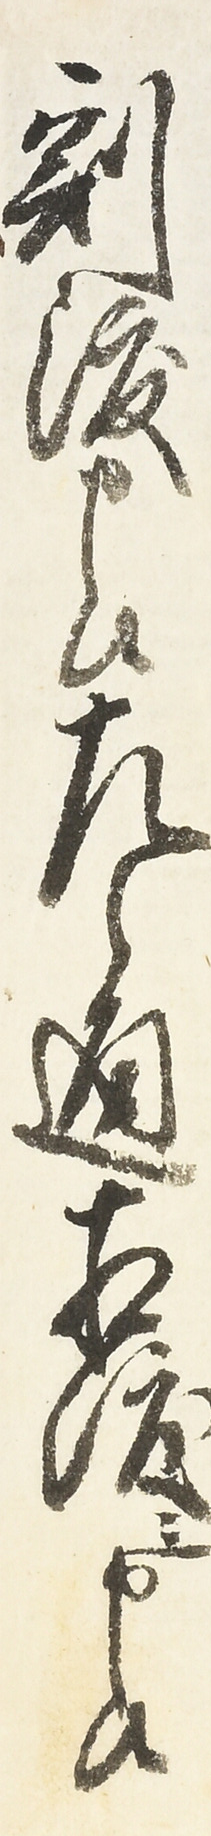割渡申候左之通相渡シ申候
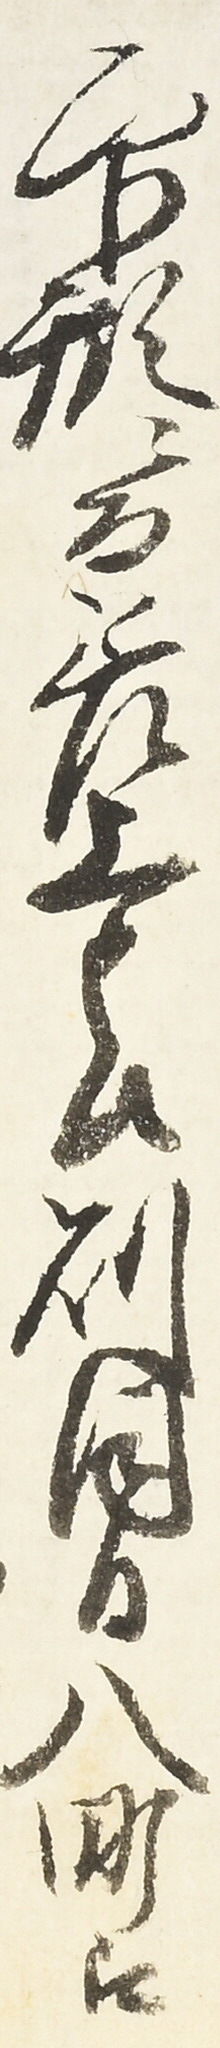印形に而差上申候則同日八町江
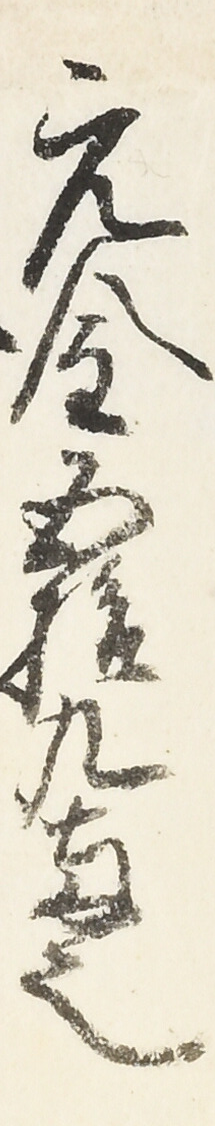元金五拾九両也
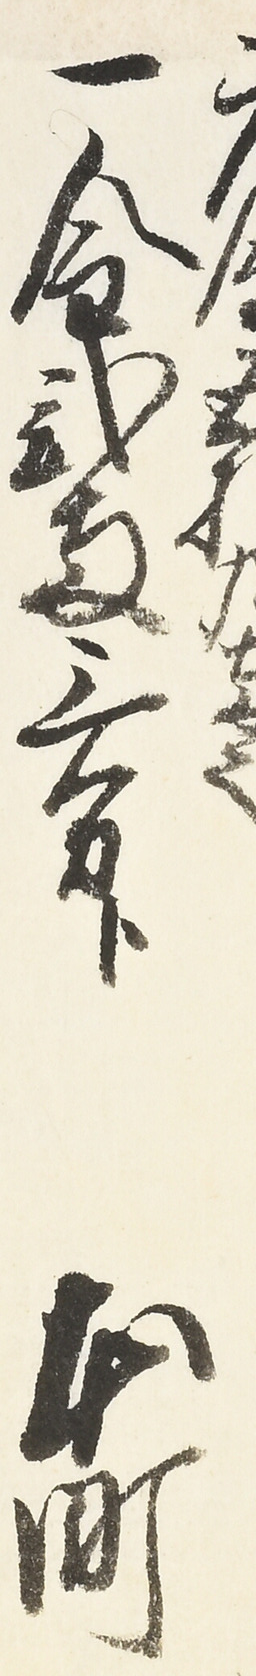一金弐両三分ト本町
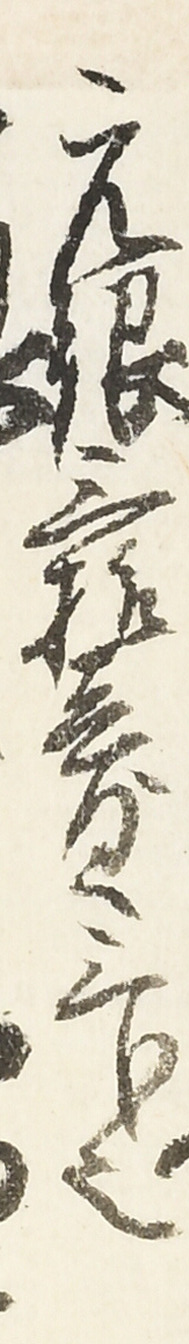元銀三拾壱匁三分也
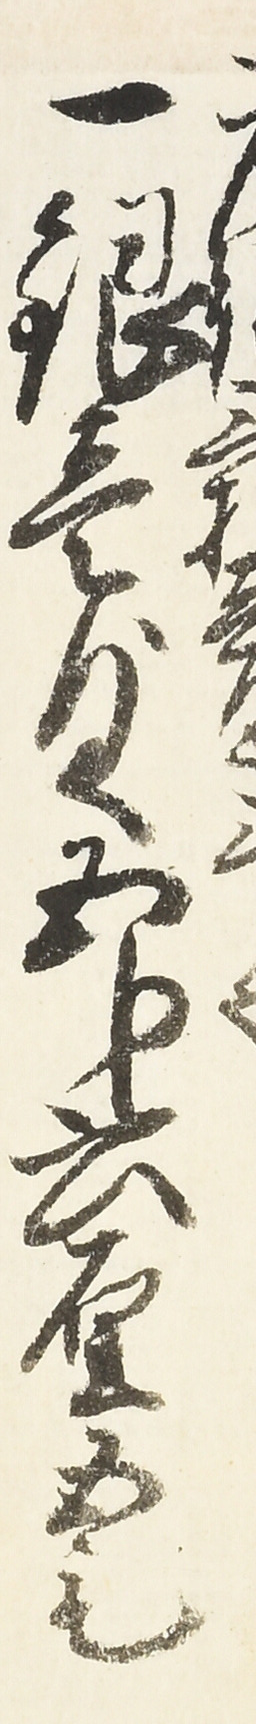一銀壱匁五分六厘五毛
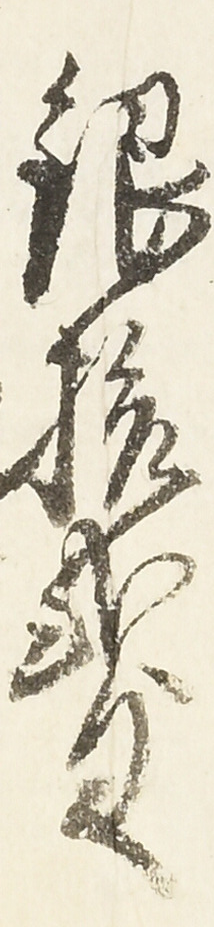銀拾弐匁
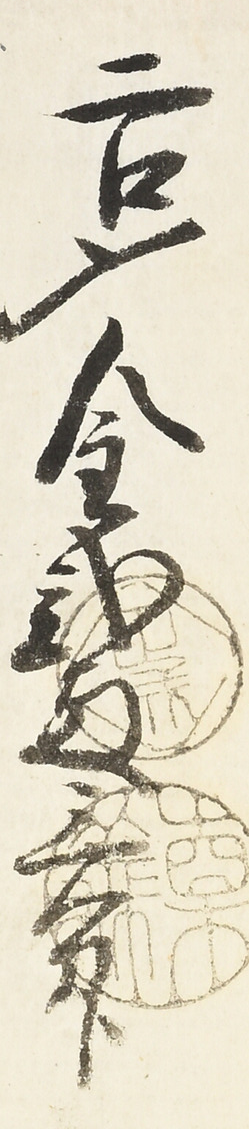二口〆金弐両三厘
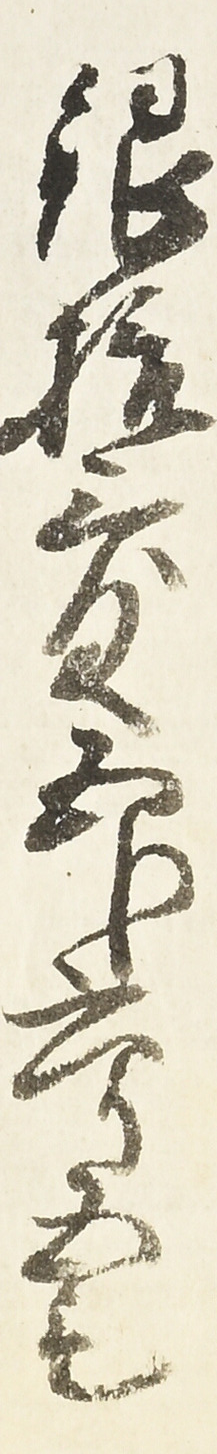銀拾三匁五分六厘五毛
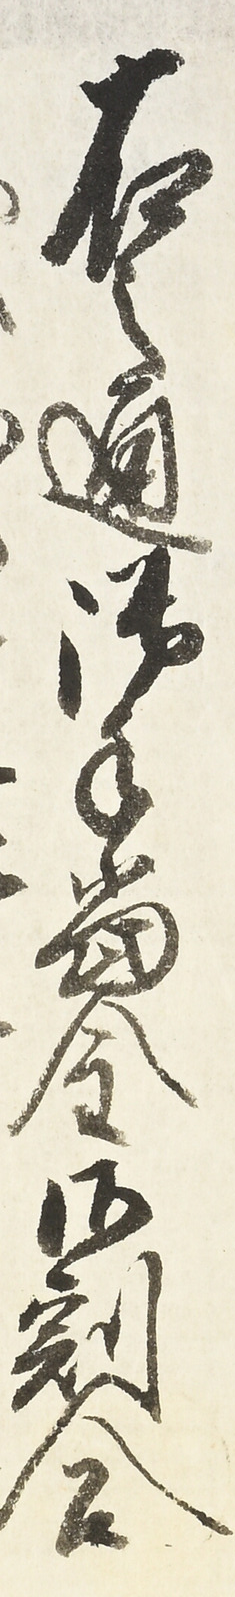右之通御手当金御割合
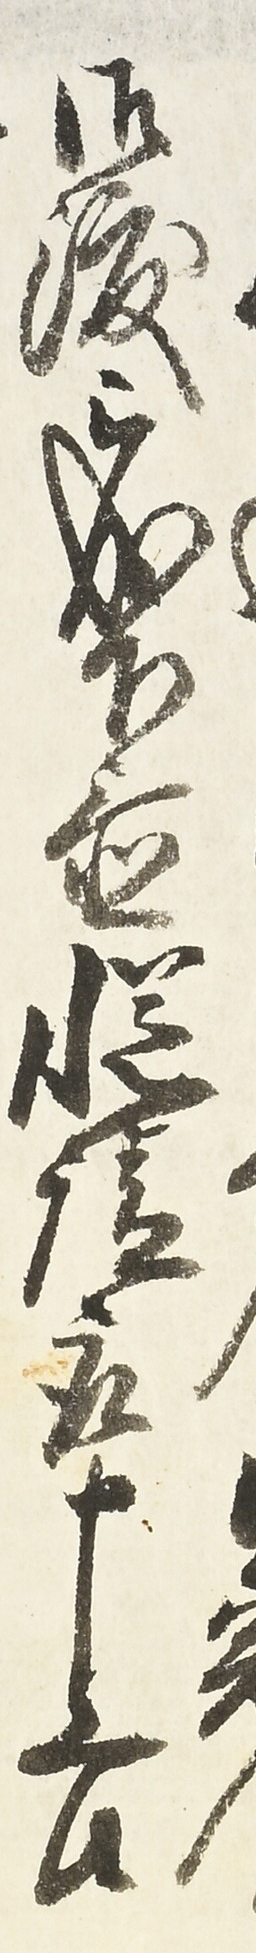御渡被成下置慥請取申上候
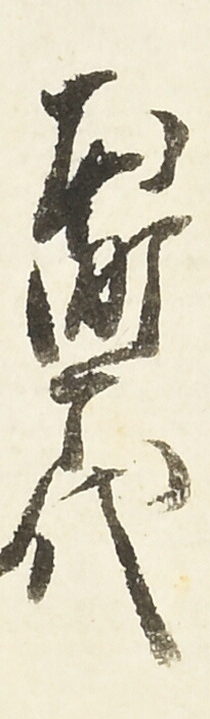本町丁代
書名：御才覚金御利足割渡扣帳
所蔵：伊那市立高遠町図書館・合同会社AMANE
